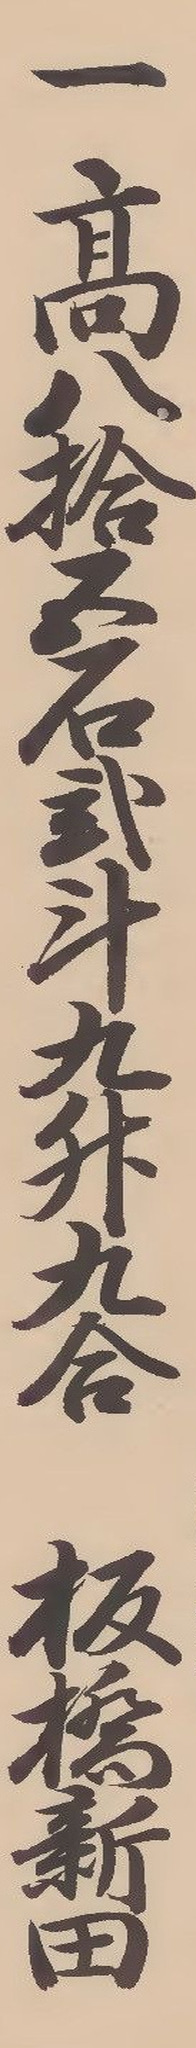一高八拾五石弐斗九升九合板橋新田
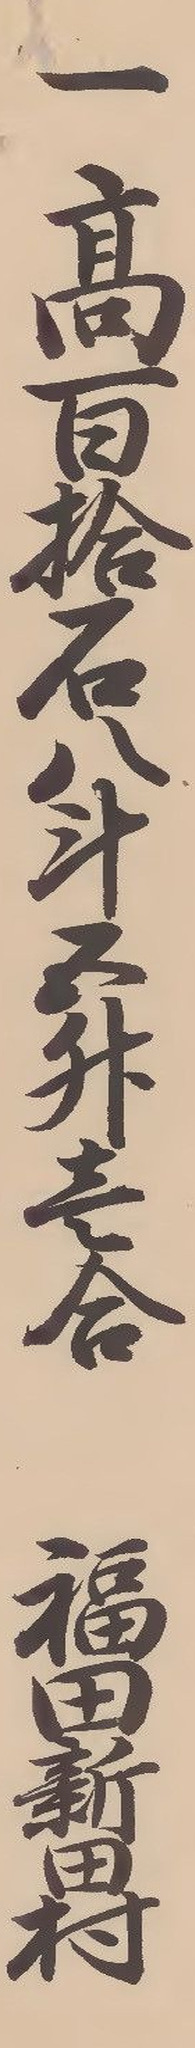一高百拾石八斗五升壱合福田新田村
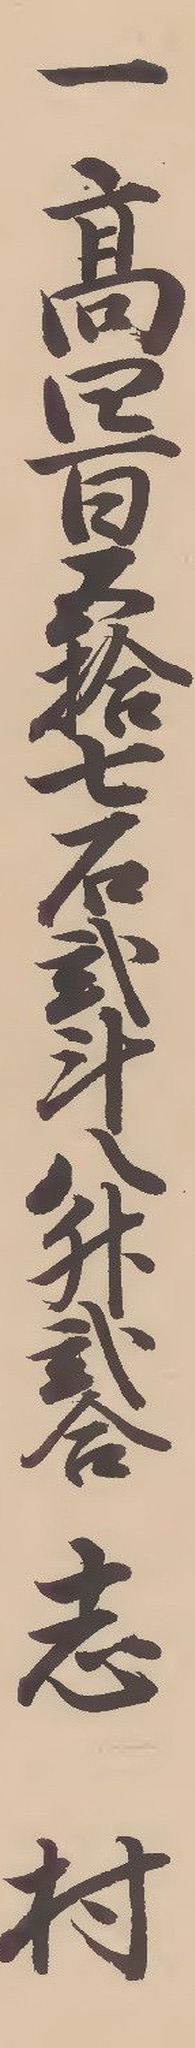一高四百五拾七石弐斗八升弐合志村

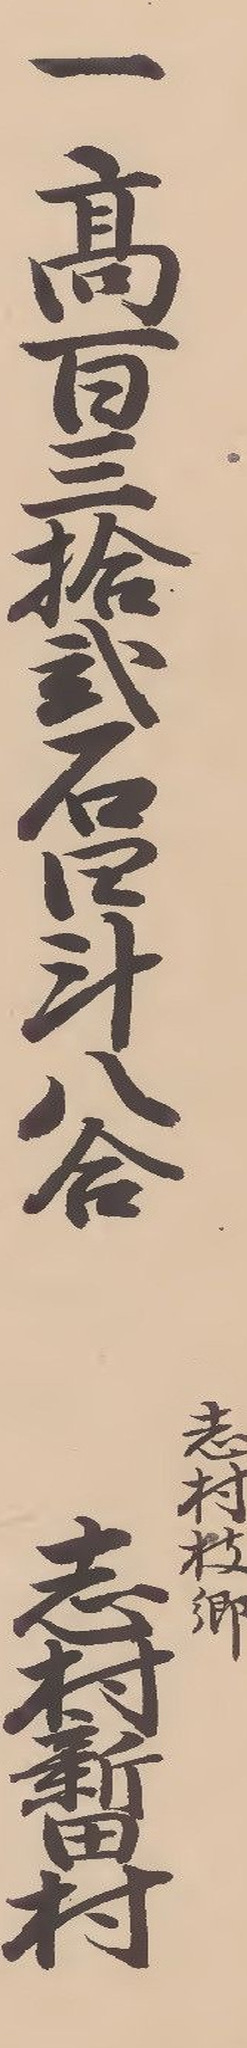一高百三拾弐石四斗八合志村新田村
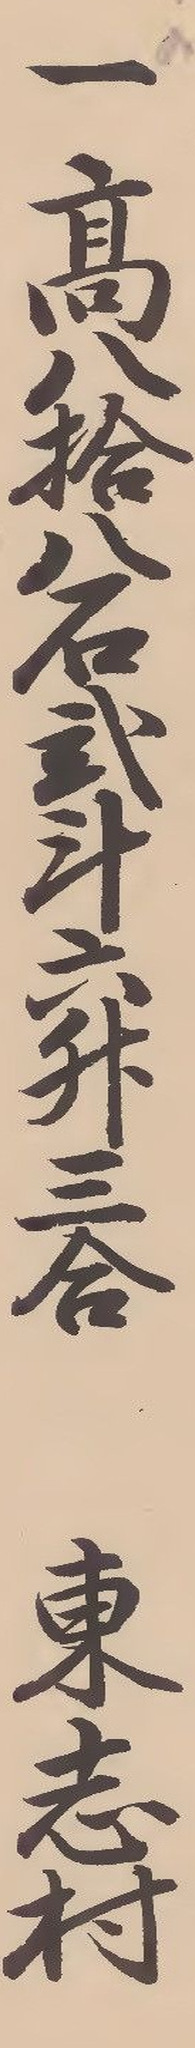一高八拾八石弐斗六升三合東志村
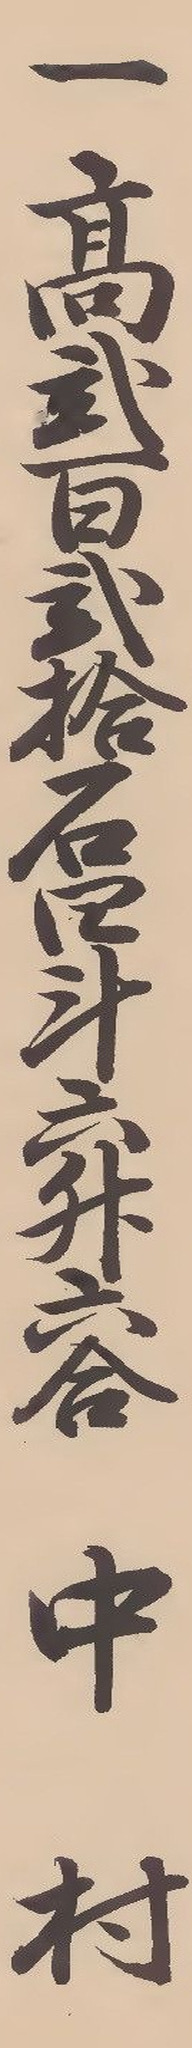一高弐百弐拾石四斗六升六合中村
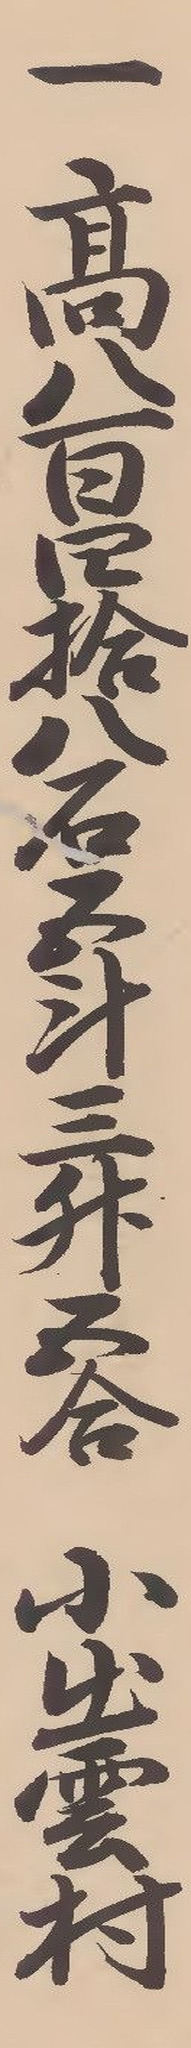一高八百四拾八石五斗三升五合小出雲村
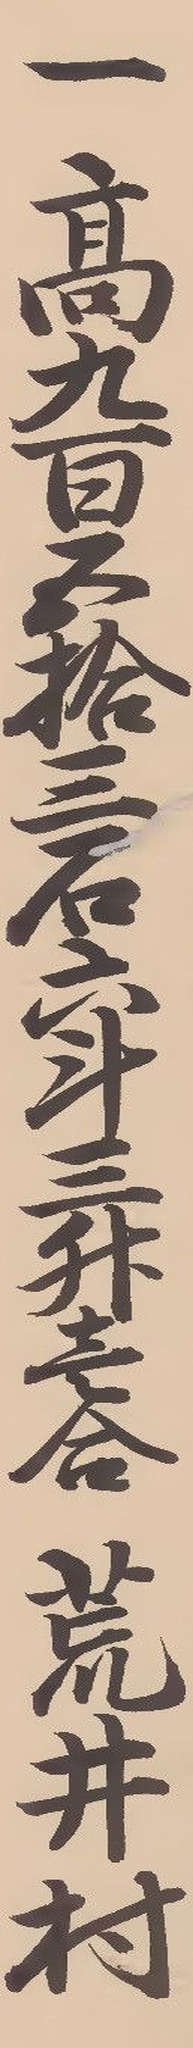一高九百五拾三石六斗三升壱合荒井村
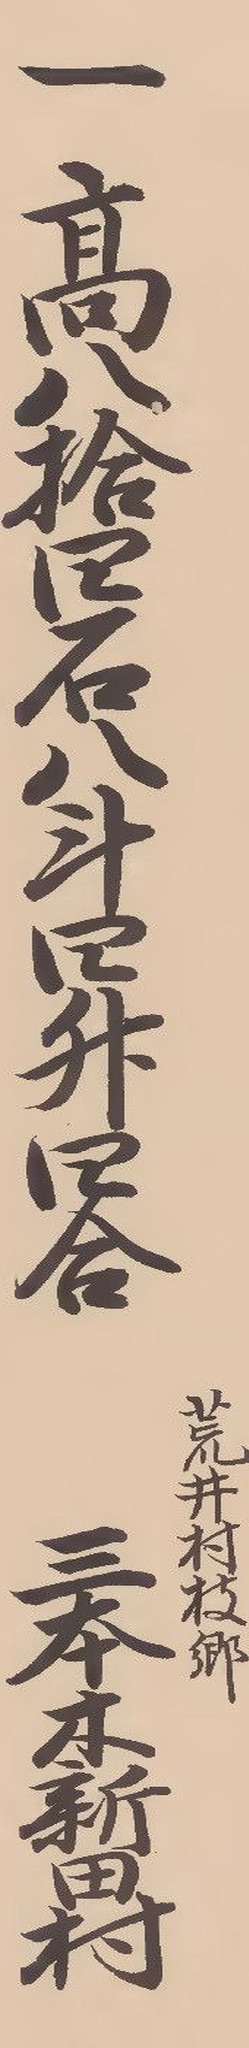一高八拾四石八斗四升四合三本木新田村
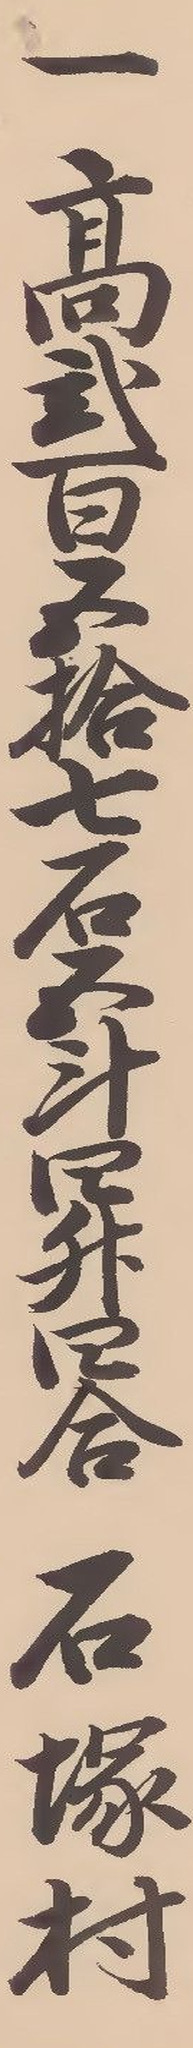一高弐百五拾七石五斗四升四合石塚村
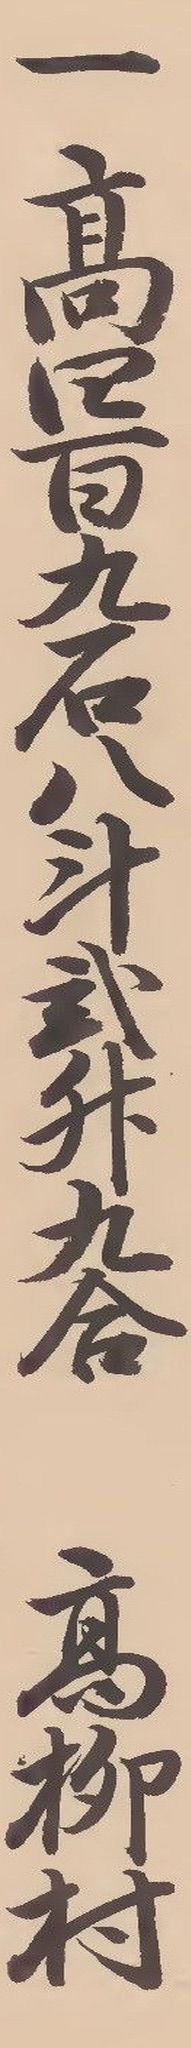一高四百九石八斗弐升九合高柳村

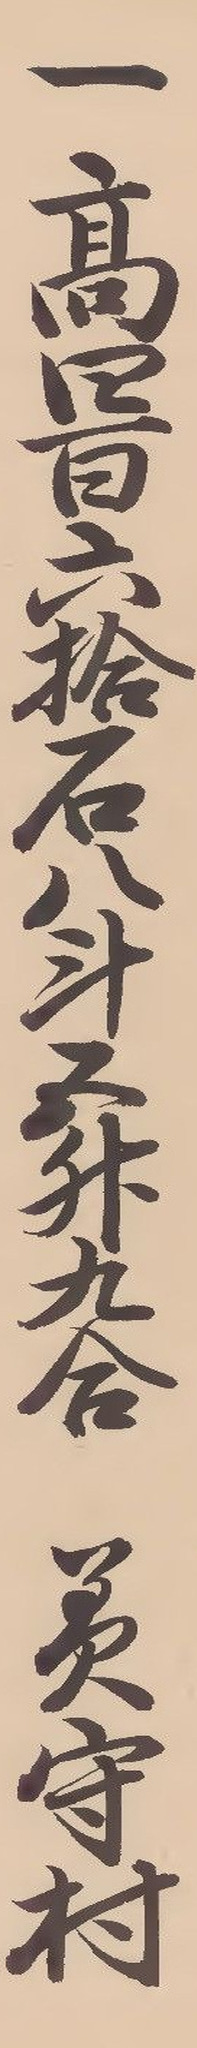一高四百六拾石八斗五升九合美守村
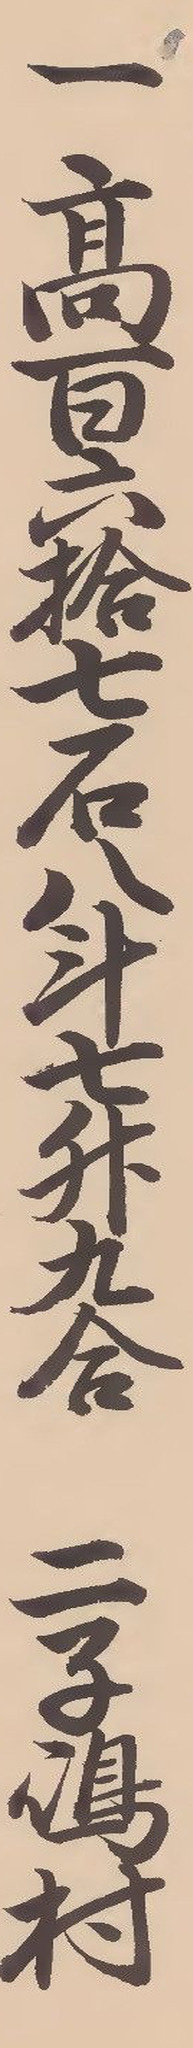一高百六拾七石八斗七升九合二子島村
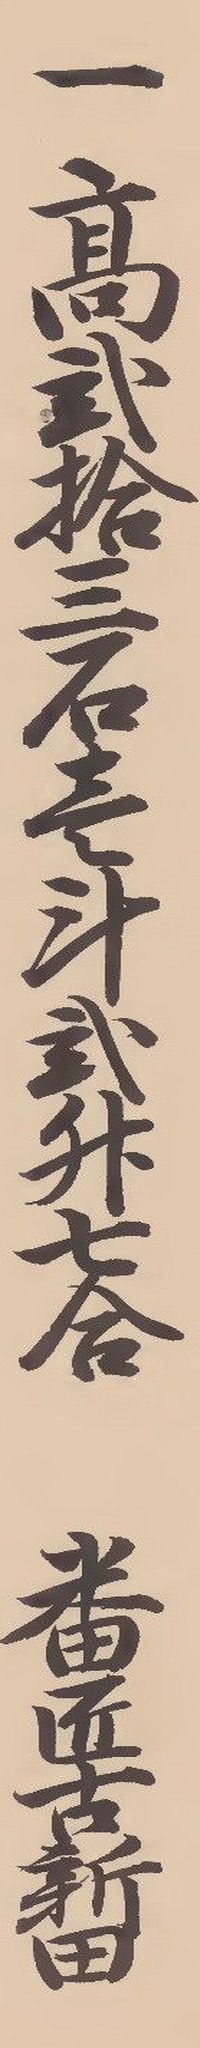一高弐拾三石壱斗弐升七合番匠古新田
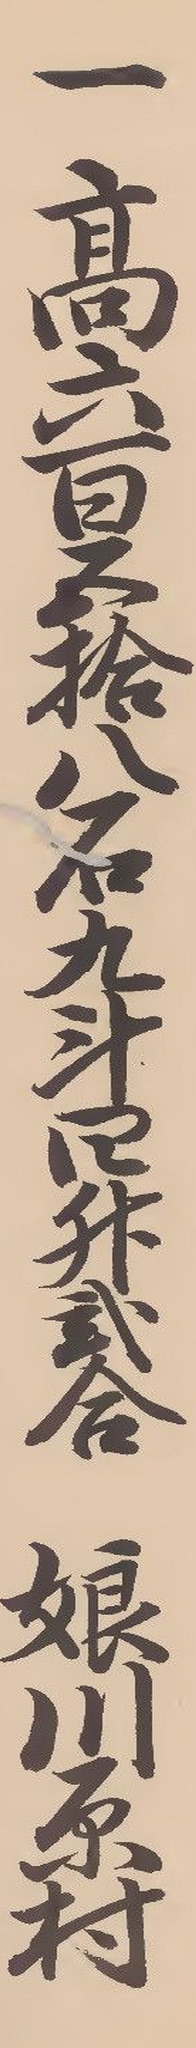一高六百五拾八石九斗四升弐合娘川原村
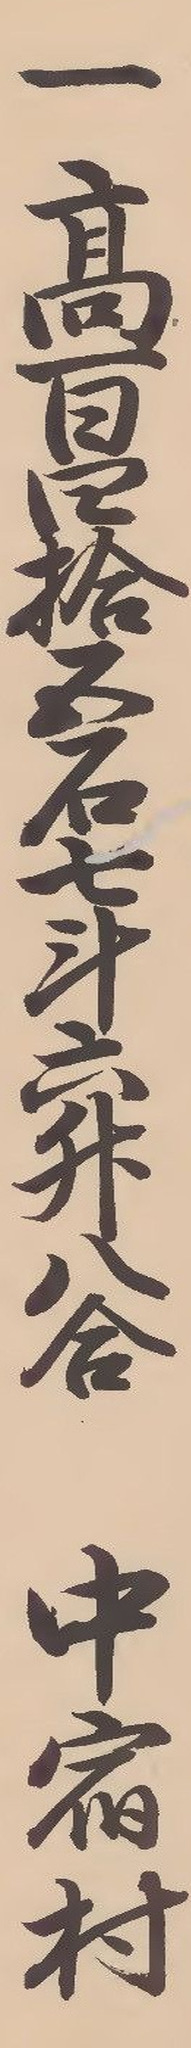一高百四拾五石七斗六升八合中宿村
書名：越後国郷帳　上
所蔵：国立公文書館 National Archives of Japan
